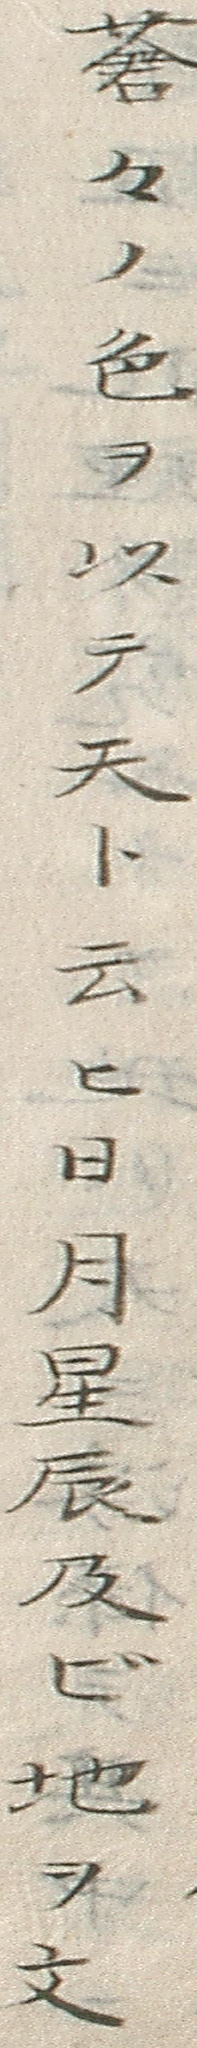蒼々ノ色ヲ以テ天ト云ヒ日月星辰及ビ地ヲ文
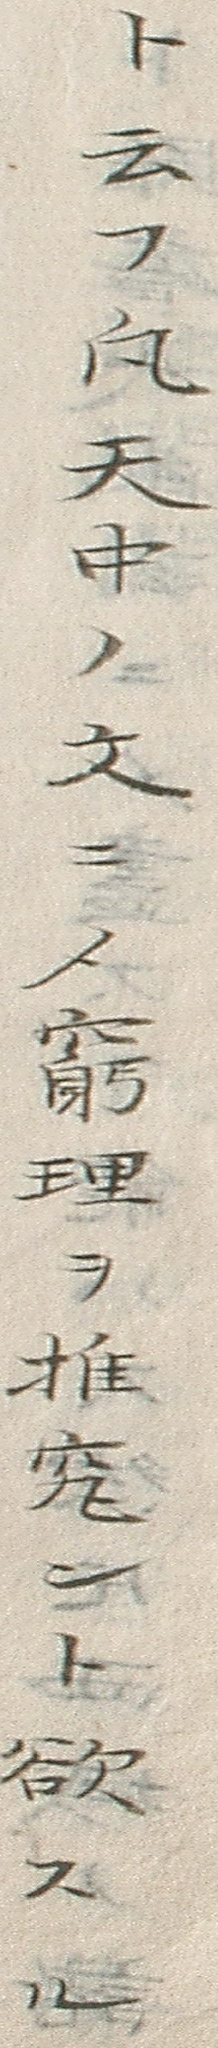ト云フ凡天中ノ文ニシテ窮理ヲ推究ント欲スル

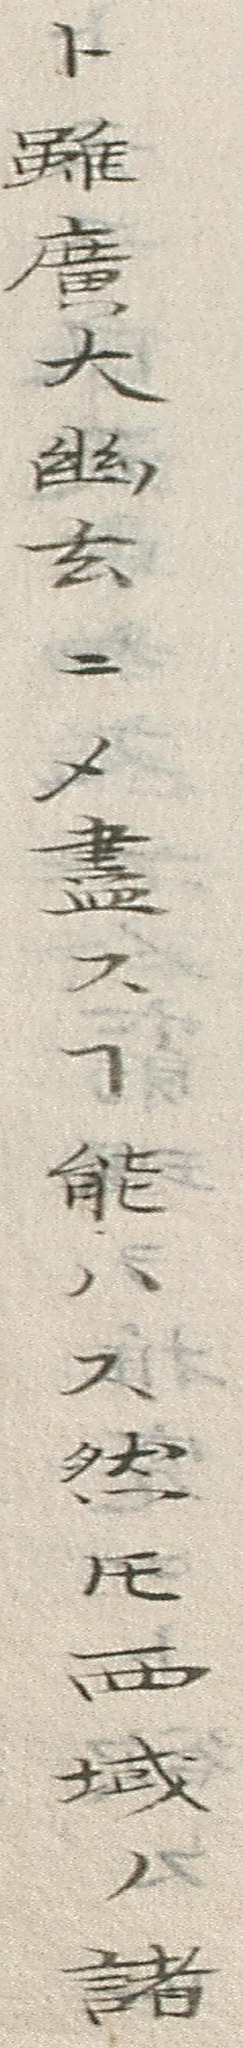ト雖広大幽玄ニシテ尽スコト能ハス然トモ西域ノ諸
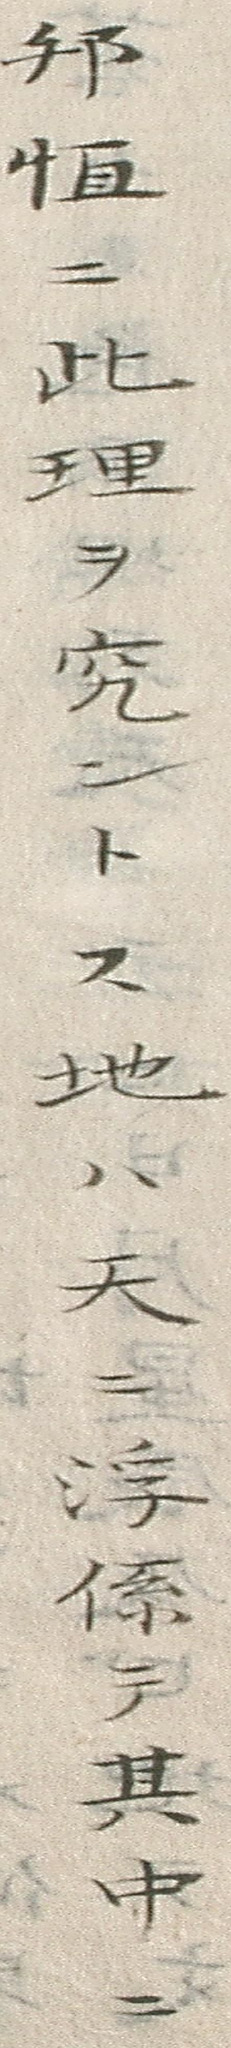邦恒ニ此理ヲ究ントス地ハ天ニ浮係テ其中ニ
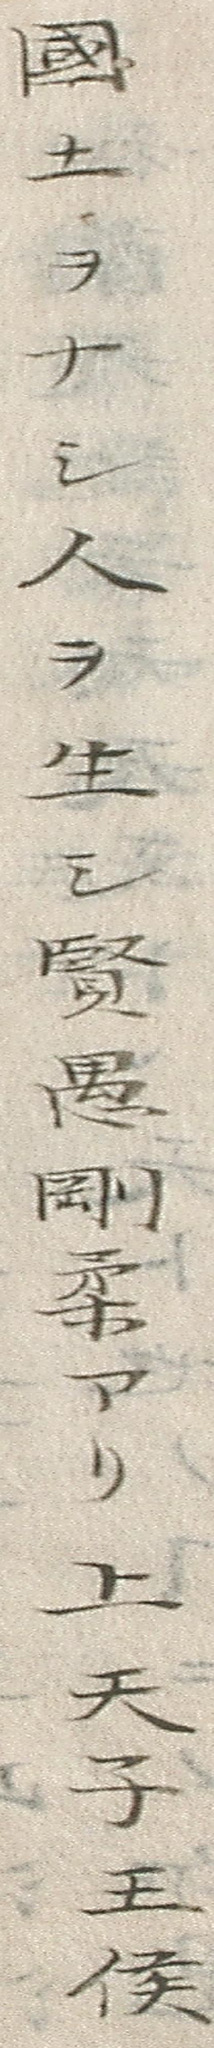国土ヲナシ人ヲ生シ賢愚剛柔アリ上天子王侯
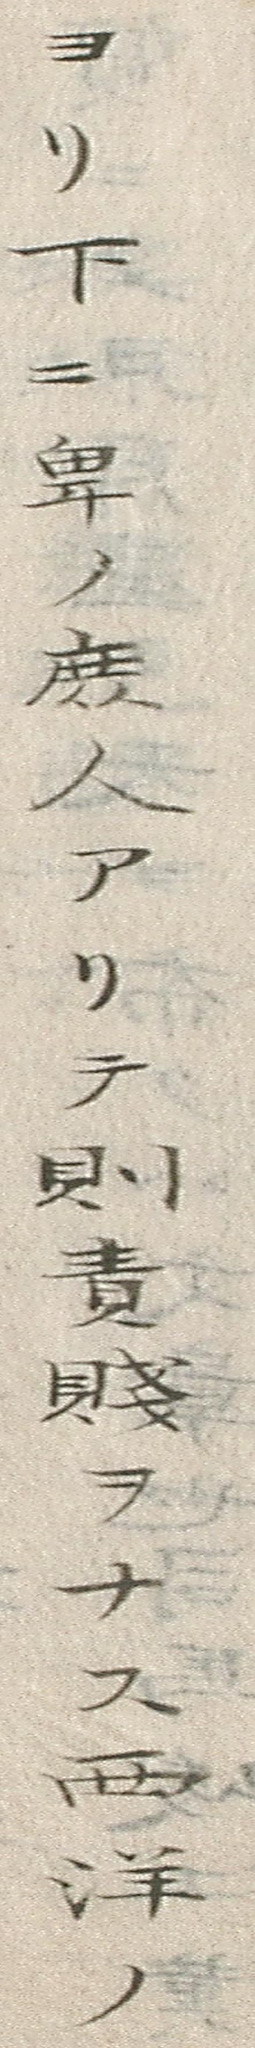ヨリ下ニ卑ノ庶人アリテ則責賎ヲナス西洋ノ
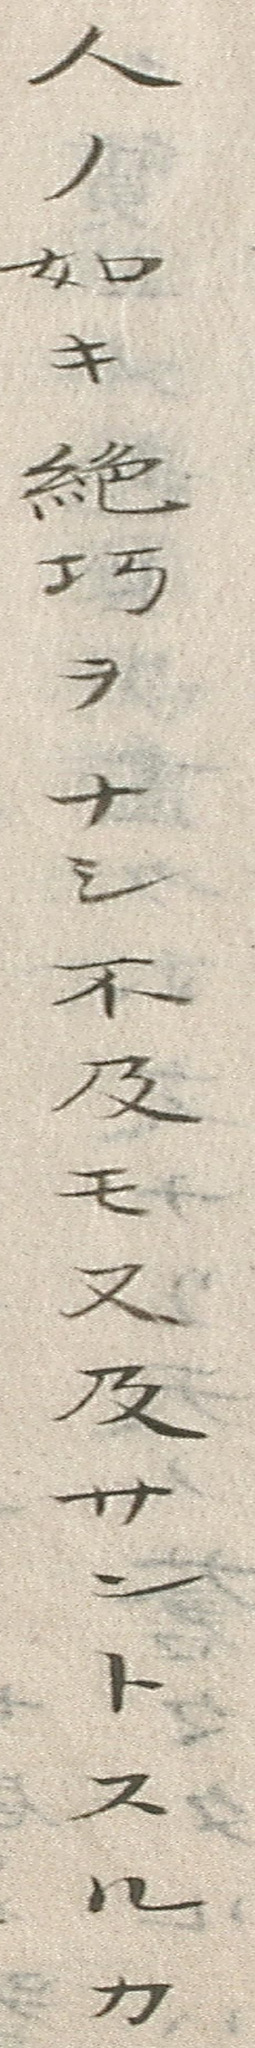人ノ如キ絶巧ヲナシ不及モ又及サントスルカ
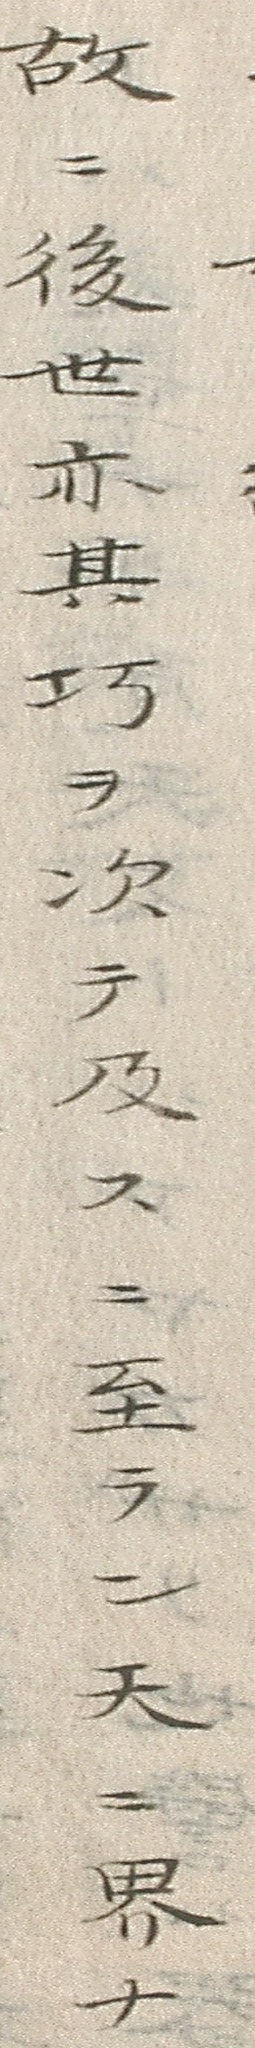故ニ後世亦其巧ヲ次テ及スニ至ラン天ニ界ナ
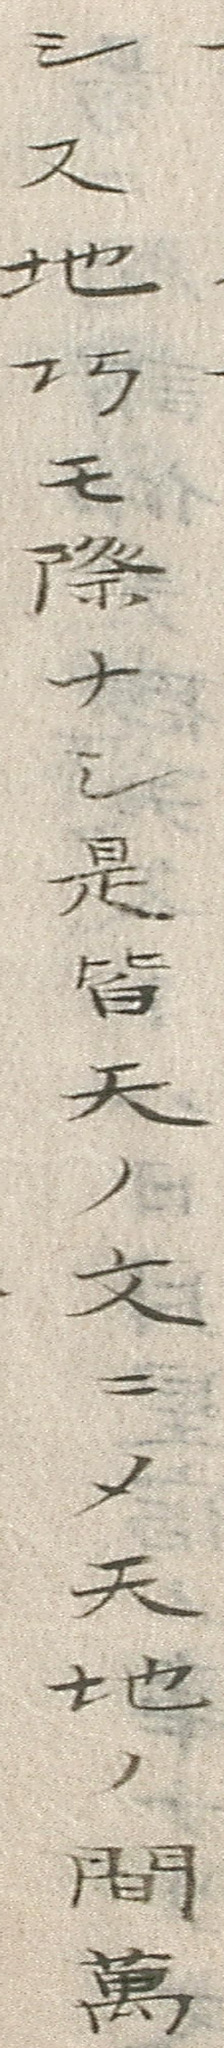シ又地巧モ際ナシ是皆天ノ文ニシテ天地ノ間万
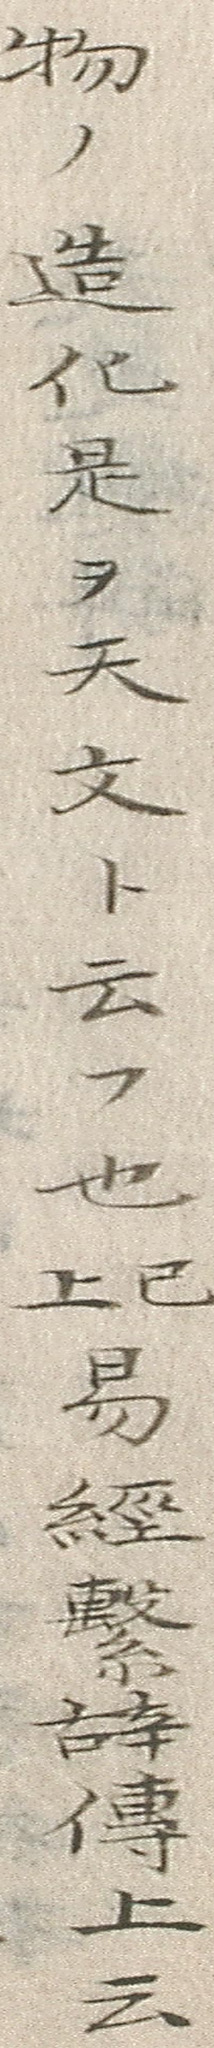物ノ造化是ヲ天文ト云フ也已上易経繋辞伝上云
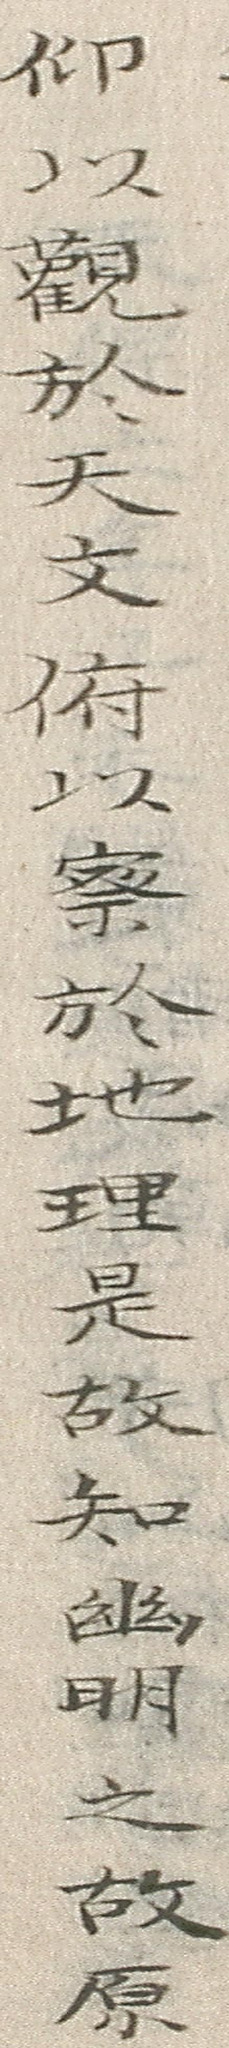仰以観於天文俯以察ス於地理是故知幽明之故原
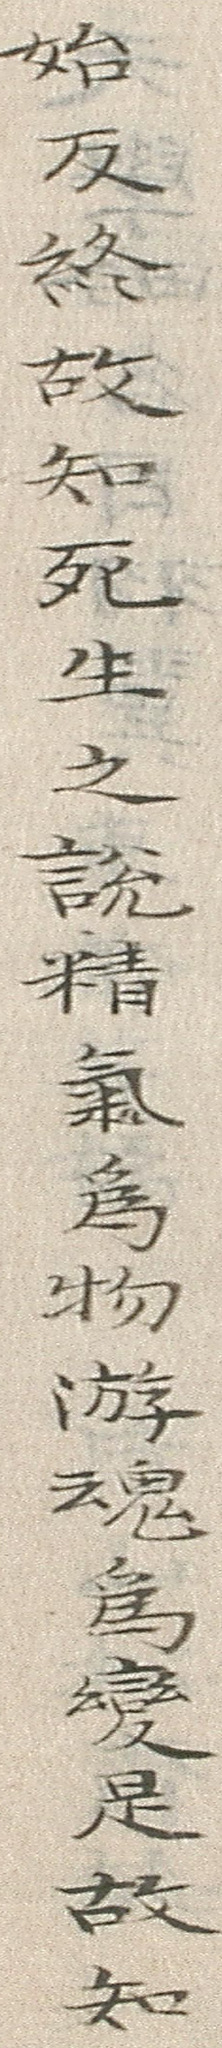始反終故知死生之説精気為物游魂為変是故知
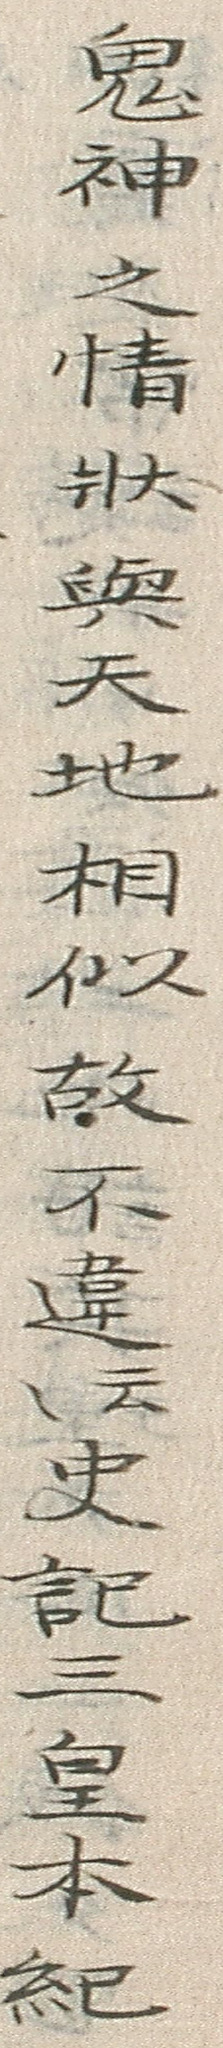鬼神之情状与天地相似故不違云〻史記三皇本紀
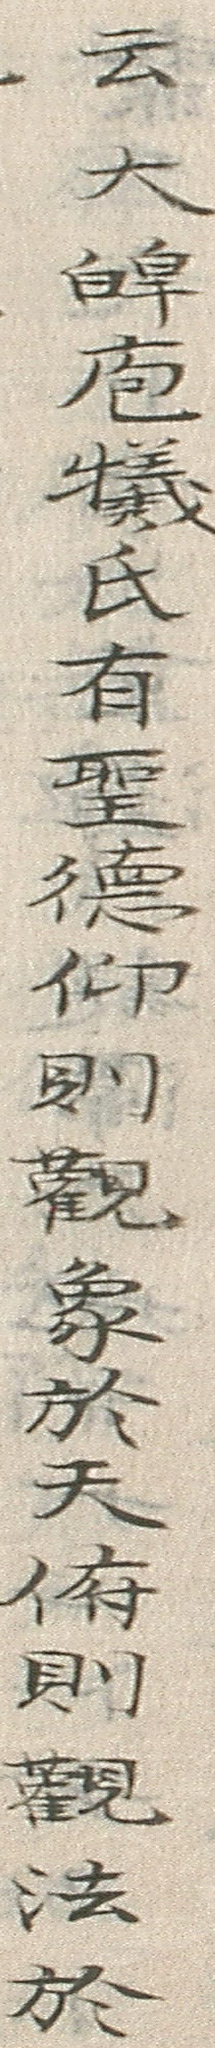云大皥庖犠氏有聖徳仰則観象於天俯則観法於
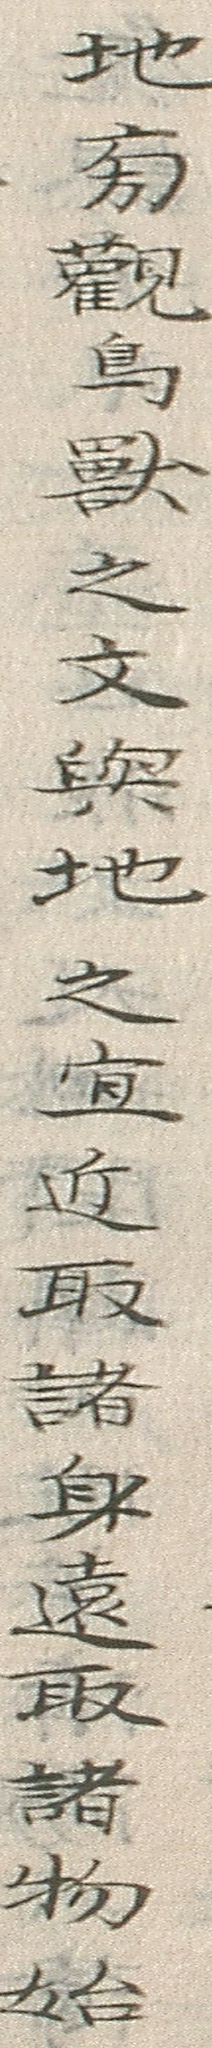地㫄観鳥獣之文与地之宜近取諸身遠取諸物始
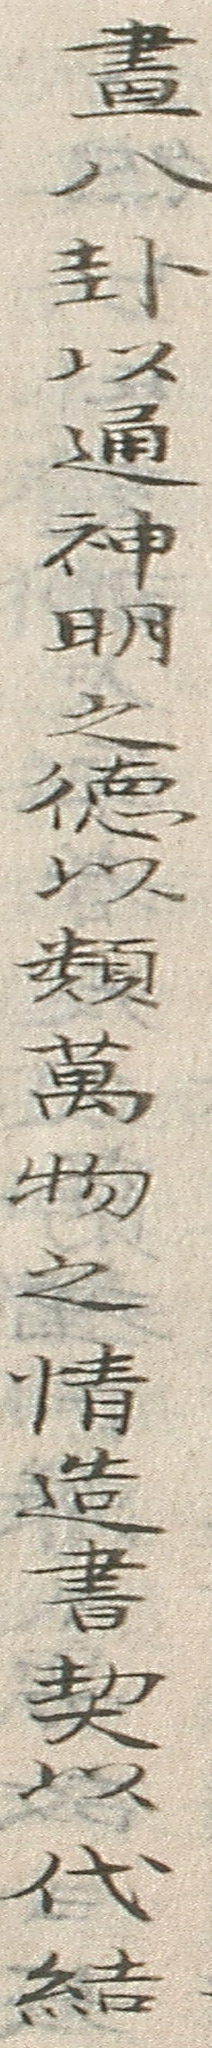画八卦以通神明之徳以類万物之情造書契以代結
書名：天學略名目羽翼　全
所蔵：東京大学地震研究所図書室 Earthquake Research Institute Library, The University of Tokyo, JAPAN
